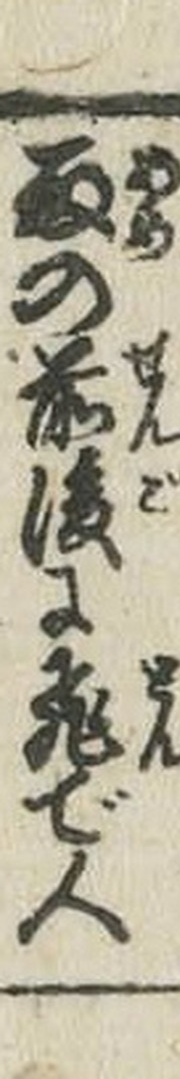雨の前後に飛で人
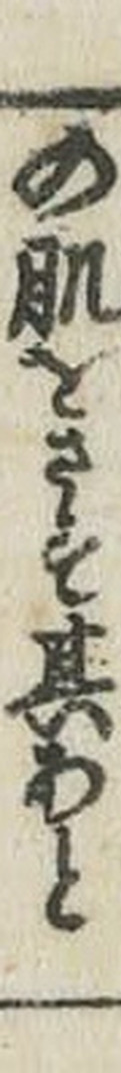の肌をさす其あと
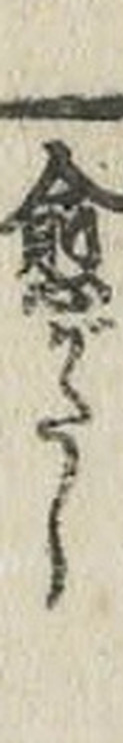愈がたし
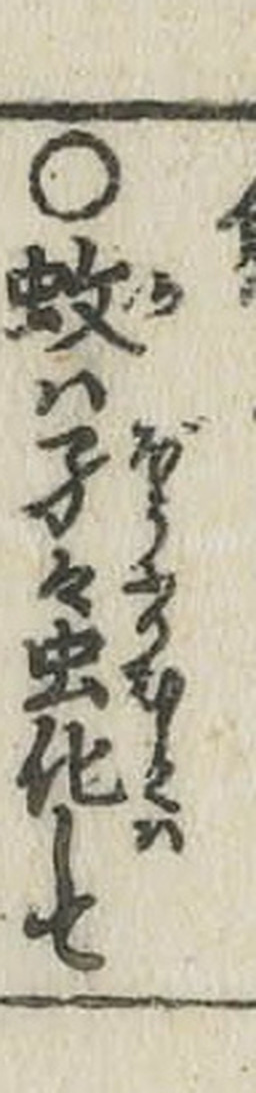○蚊は孑々虫化して
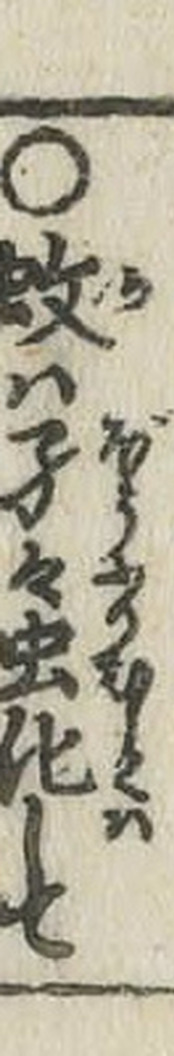○蚊は孑々虫化して
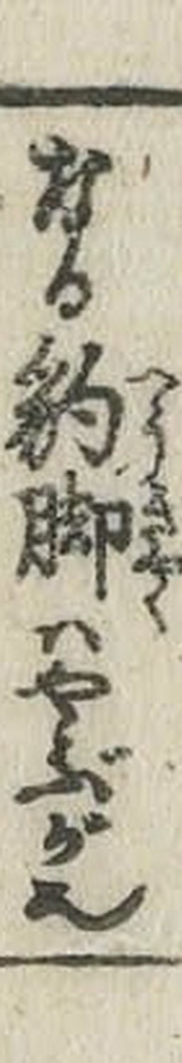なる豹脚はやぶが也
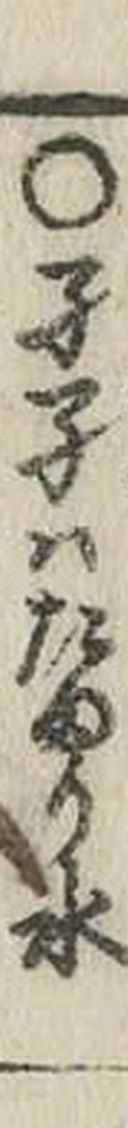○孑孑はたまり水
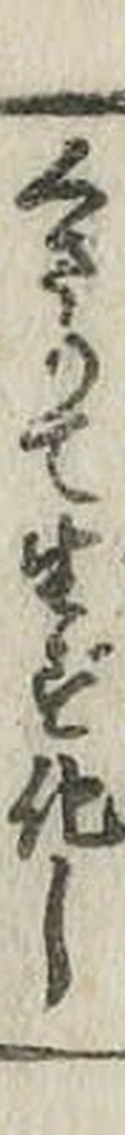くさりて生ず化し
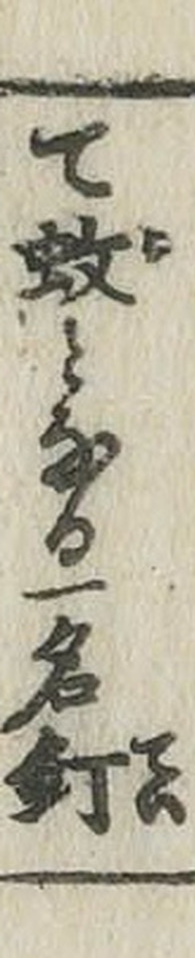て蚊となる一名釘
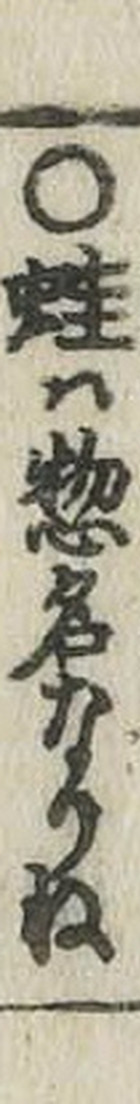○蛙は惣名なりね
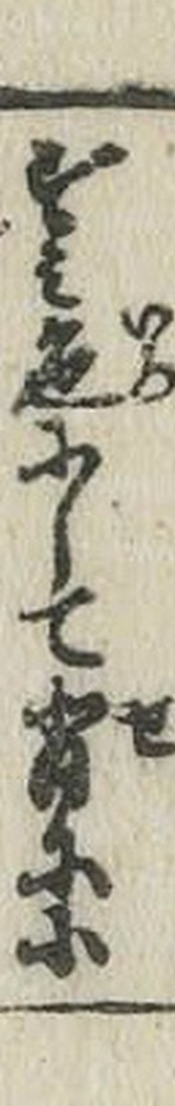ずみ色にして背に小
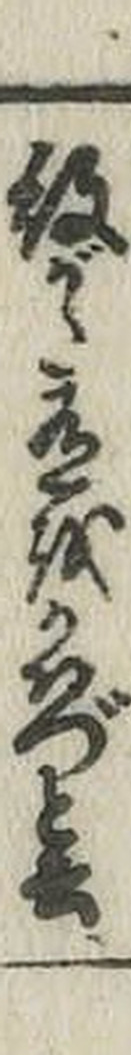紋がた有をかはづと云
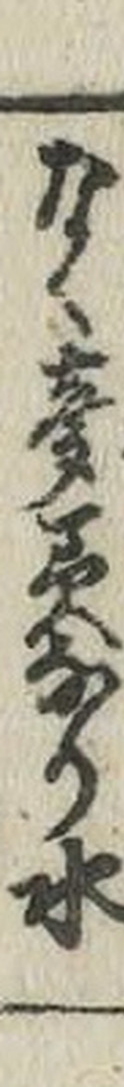なく声美なり水

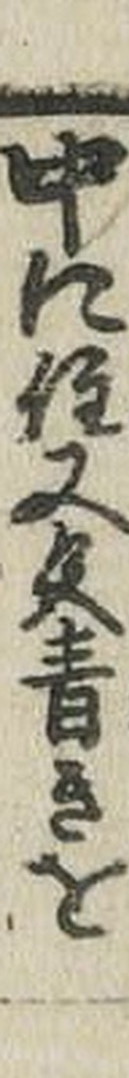中に住又色青きを
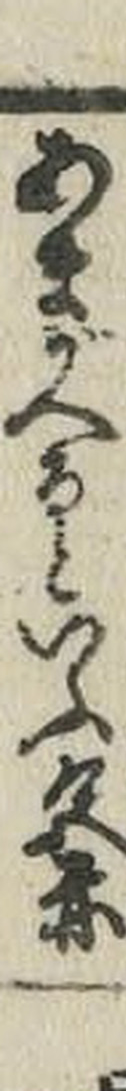あまがへるといふ色赤
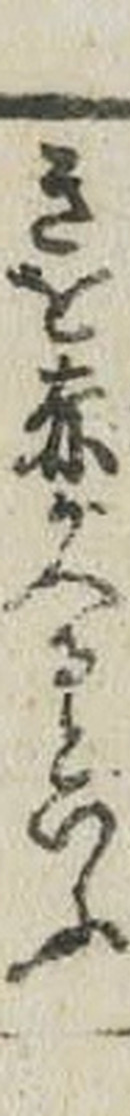きを赤がへるといふ
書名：増補頭書訓蒙図彙大成 10巻 7:巻之14-16
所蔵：東京学芸大学教育コンテンツアーカイブ
